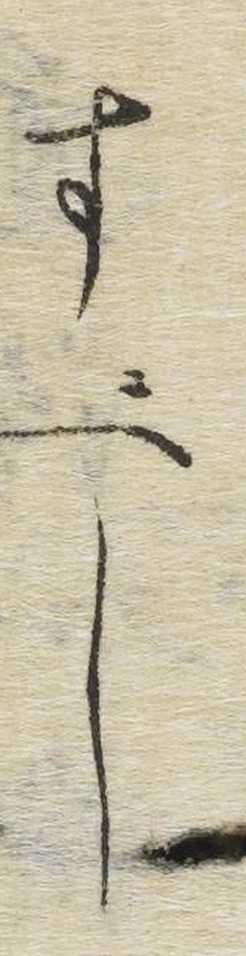すべし
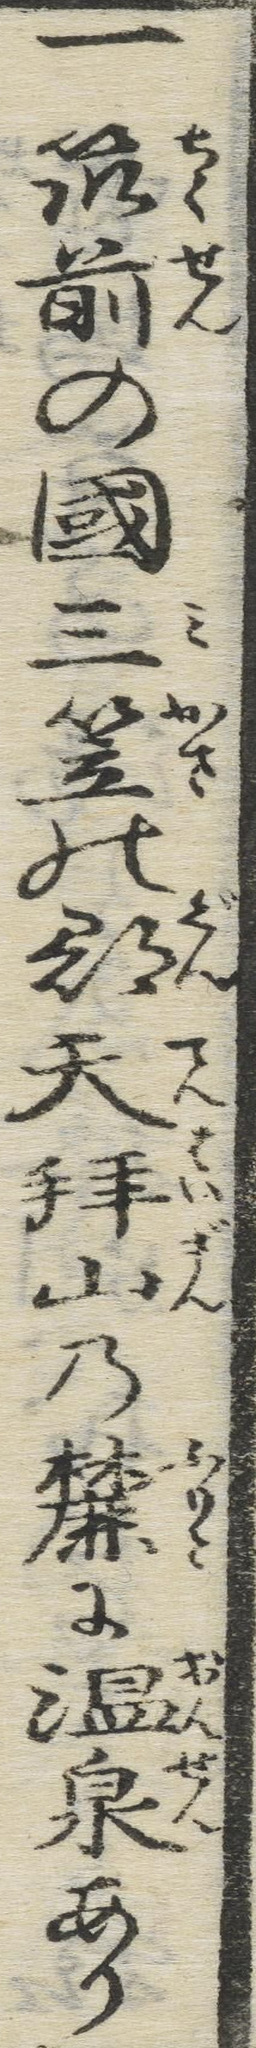一筑前の国三笠の郡天拝山の麓に温泉あり
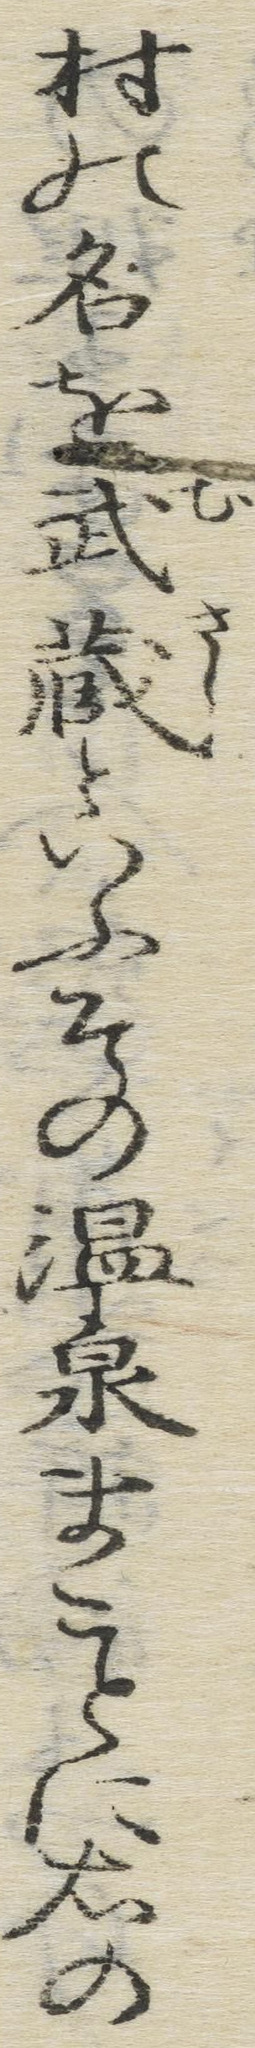村の名を武蔵といふその温泉まことに右の
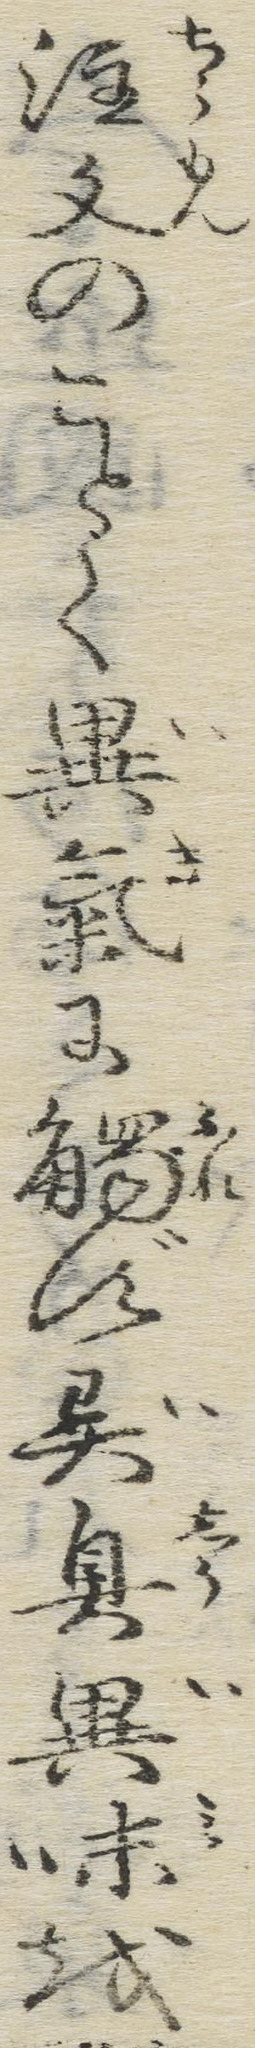注文のことく異気に触ず異臭異味を
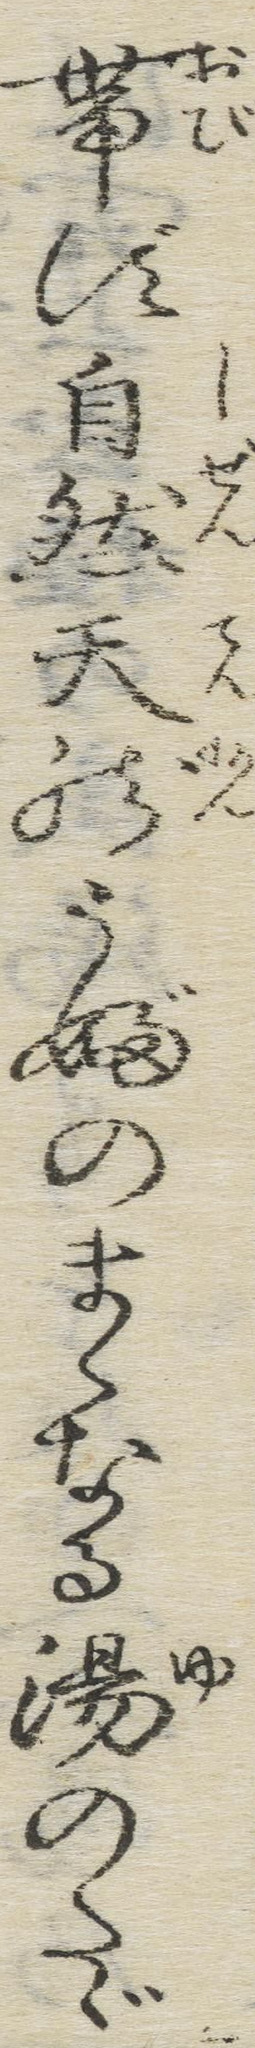帯ず自然天然うぶのまゝなる湯のたゞ
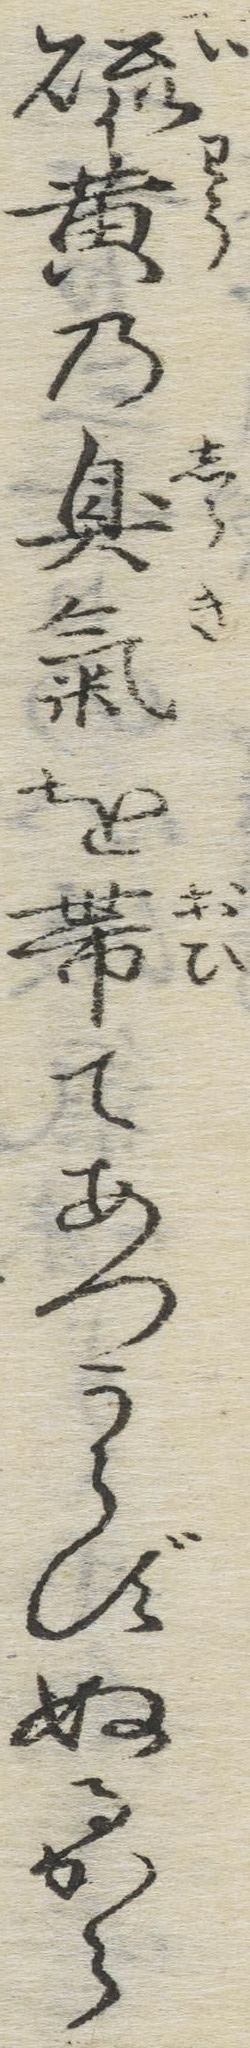硫黄の臭気を帯てあつからずぬるから
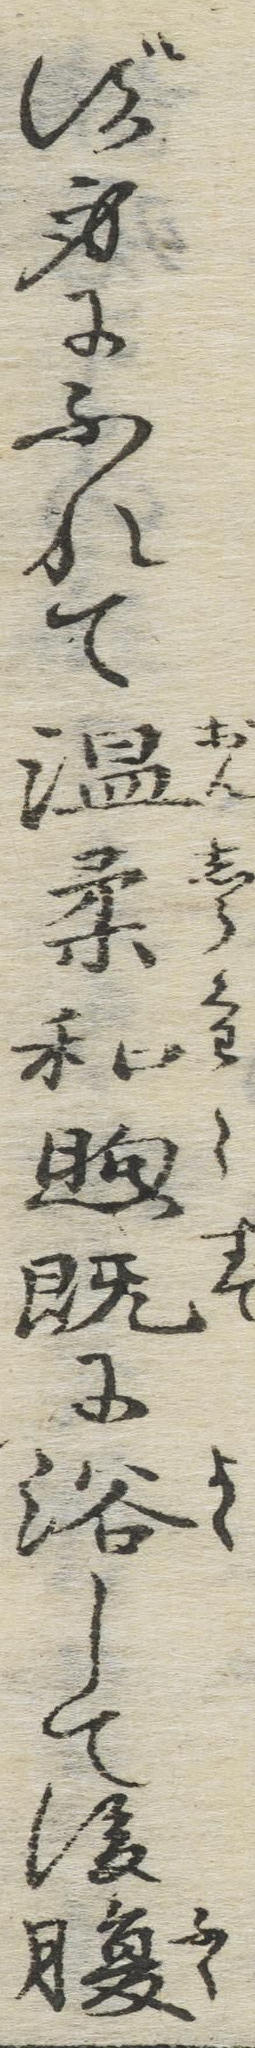ず身にふれて温柔和煦既に浴して後腹
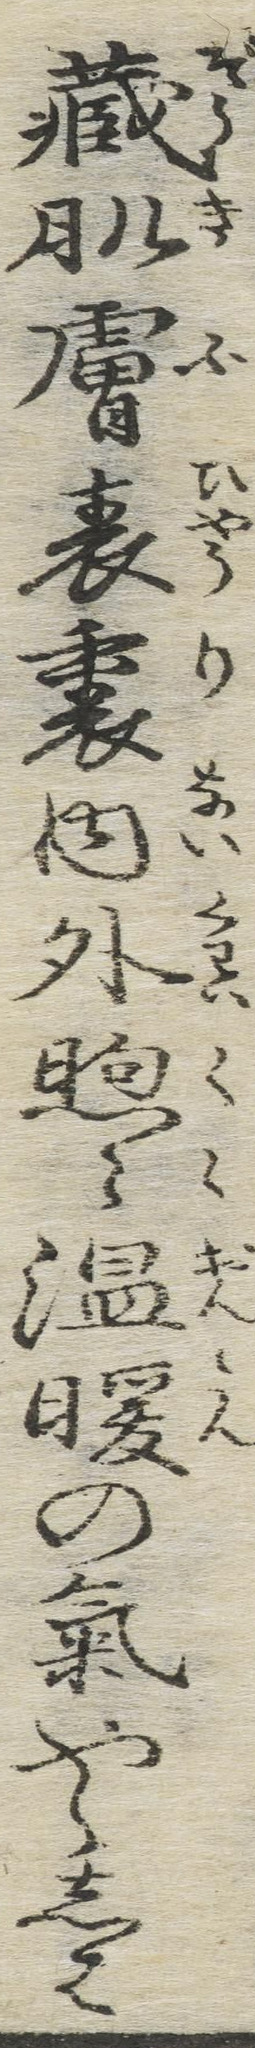蔵肌膚表裏内外煦々温暖の気やゝしは
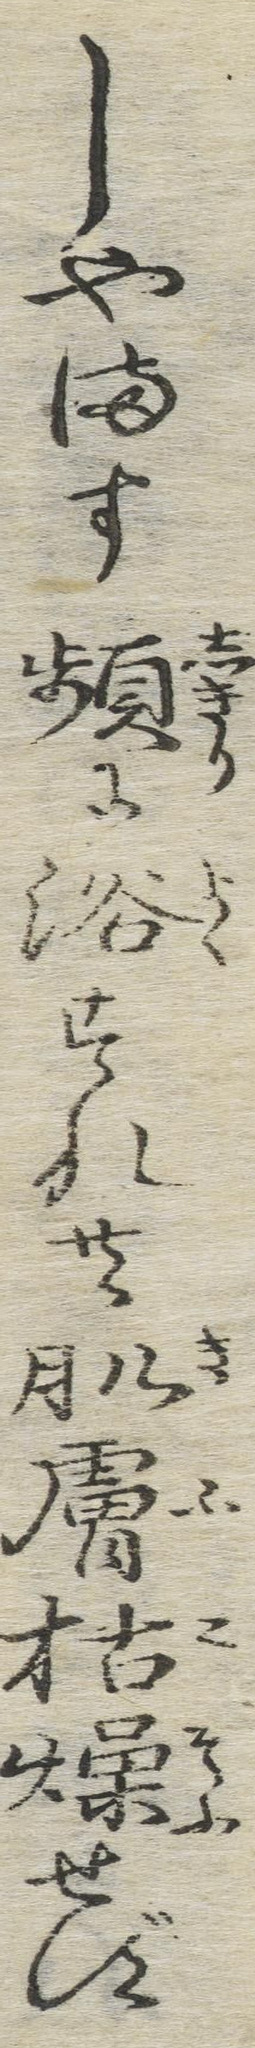しやます頻に浴すれ共肌膚枯燥せず

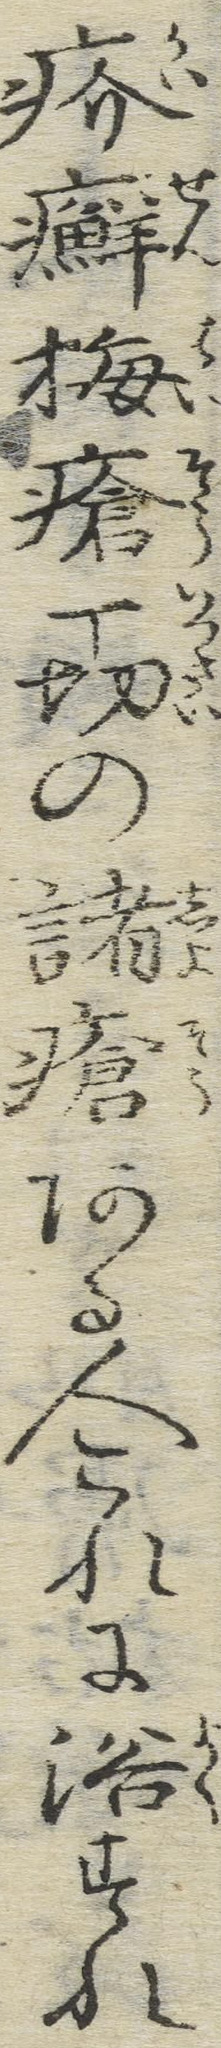疥癬梅瘡一切の諸瘡ある人これに浴すれ
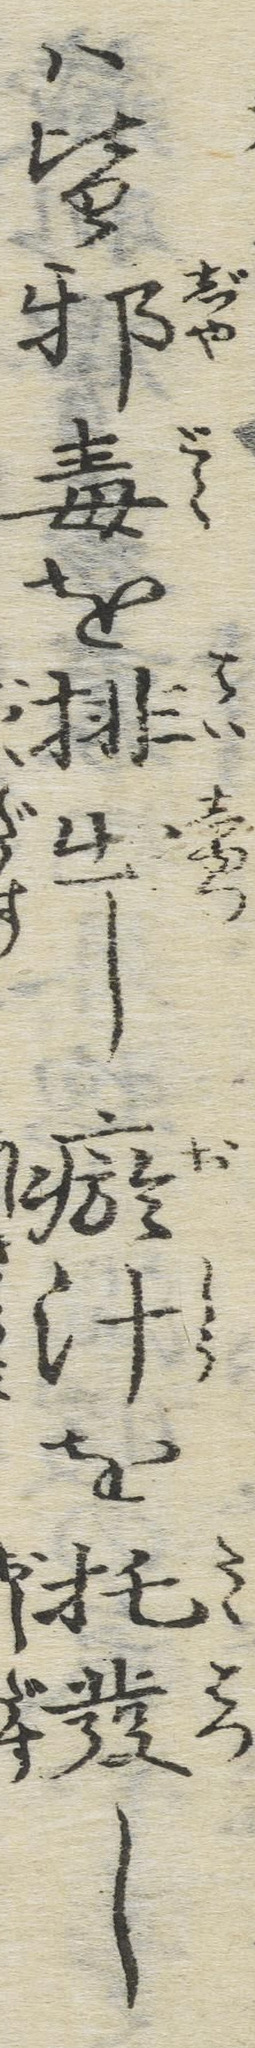は皆邪毒を排出し瘀汁を托発し
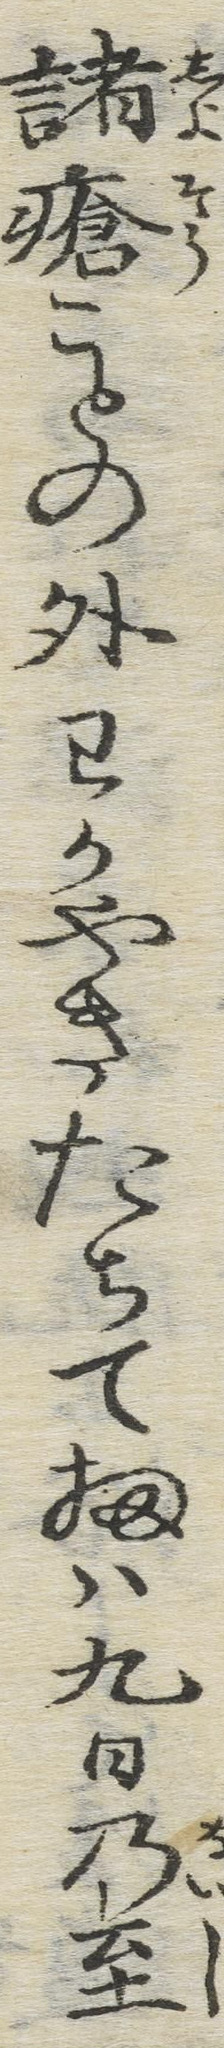諸瘡ことの外わかやきたちて扨は九日乃至
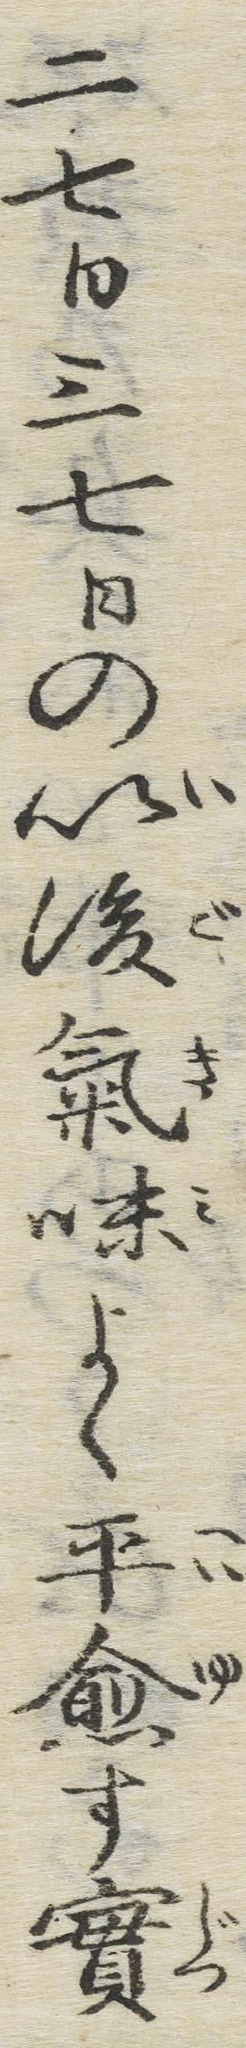二七日三七日の以後気味よく平愈す実
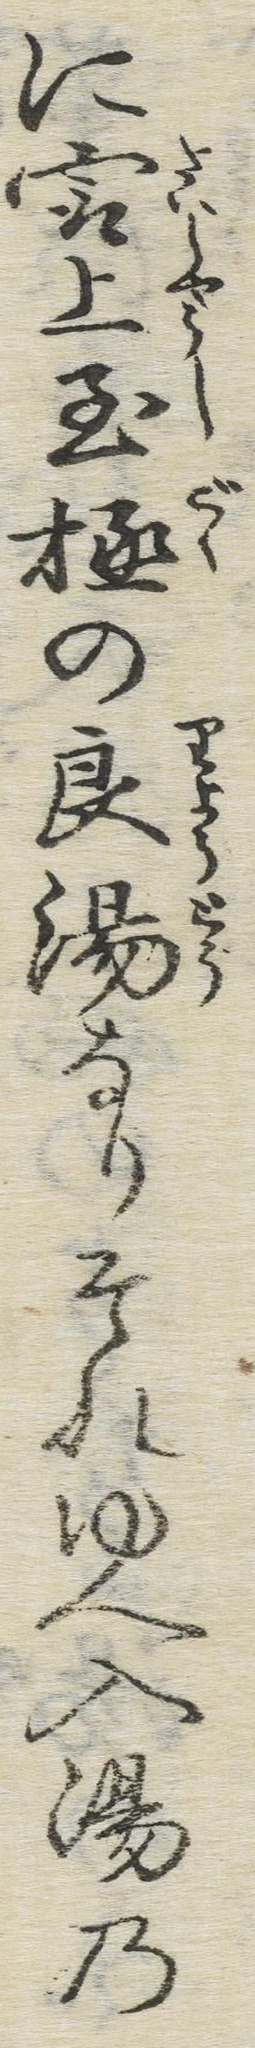に最上至極の良湯なりそれゆへ入湯の
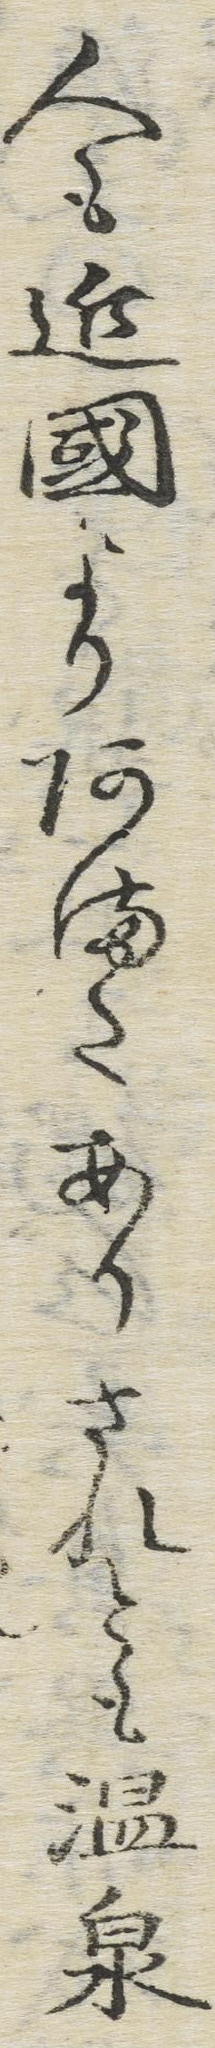人も近国よりあまたありされとも温泉
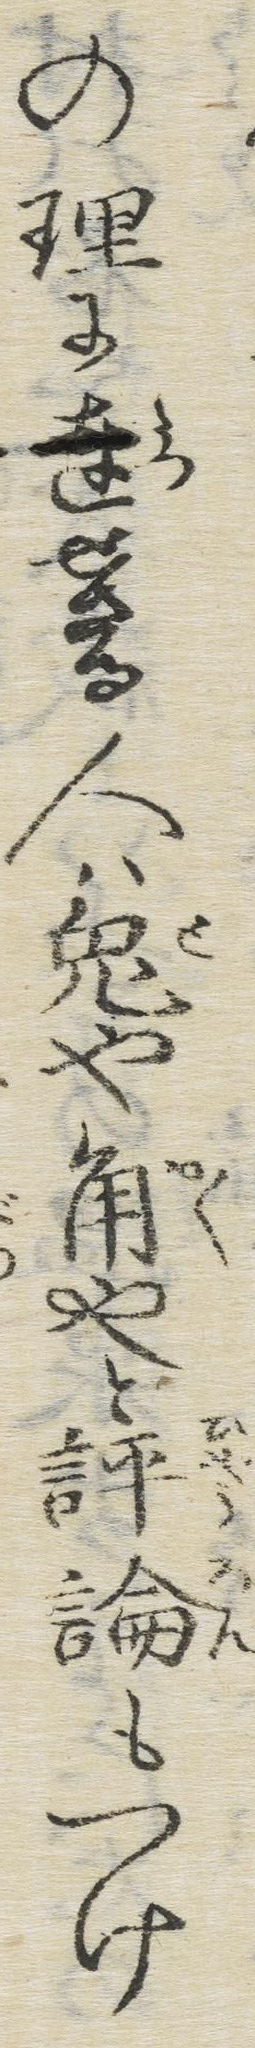の理に達せさる人は兎や角やと評論もつけ
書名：温泉考
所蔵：東京大学地震研究所図書室 Earthquake Research Institute Library, The University of Tokyo, JAPAN
